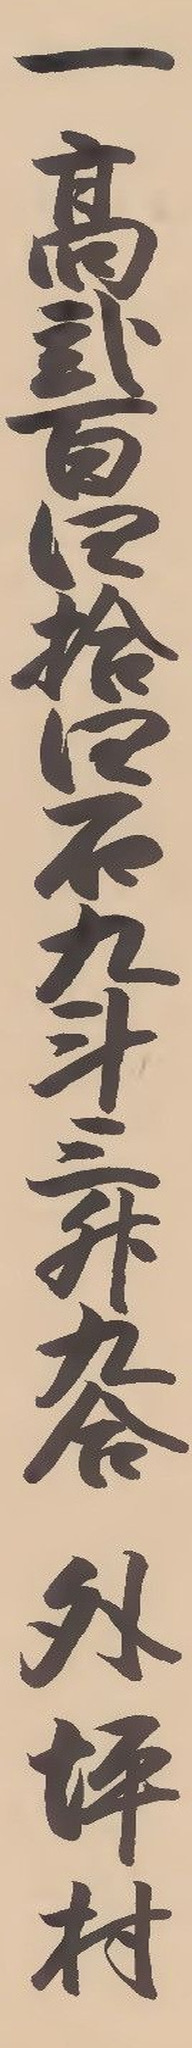一高弐百四拾四石九斗三升九合外坪村
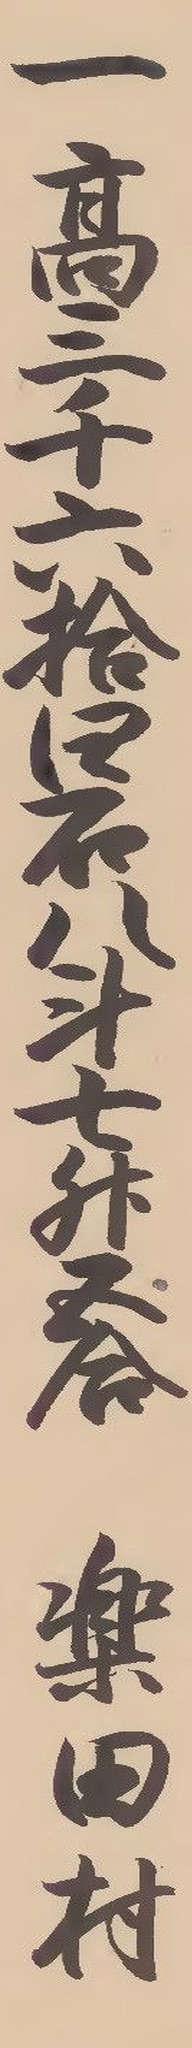一高三千六拾四石八斗七升五合楽田村

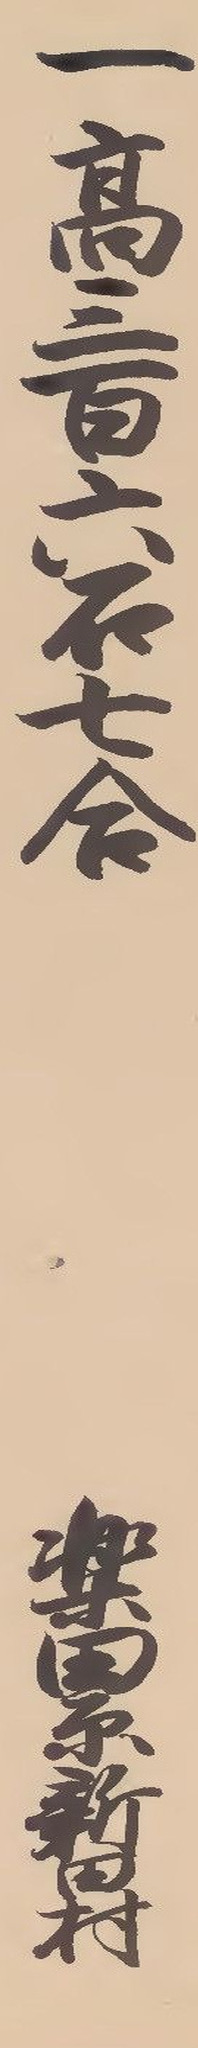一高三百六石七合楽田原新田村
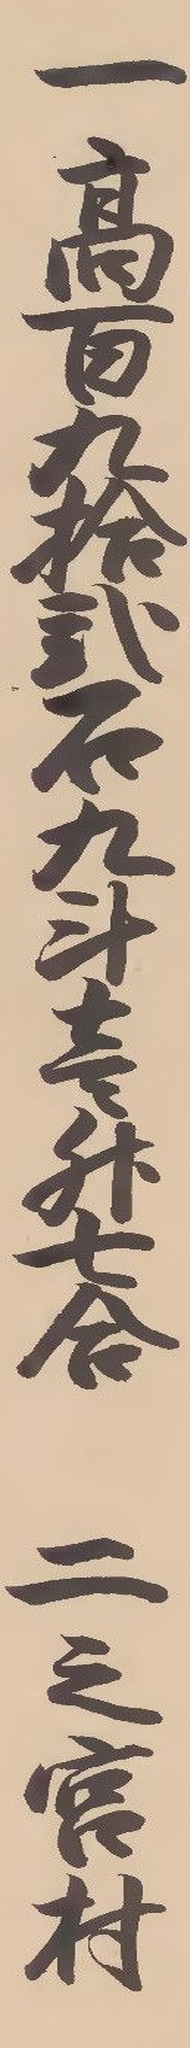一高百九拾弐石九斗壱升七合二之宮村
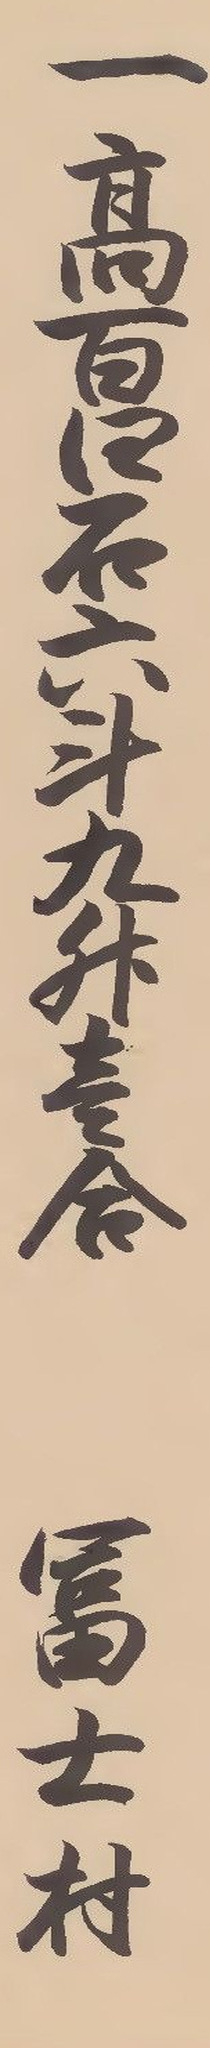一高百四石六斗九升壱合富士村
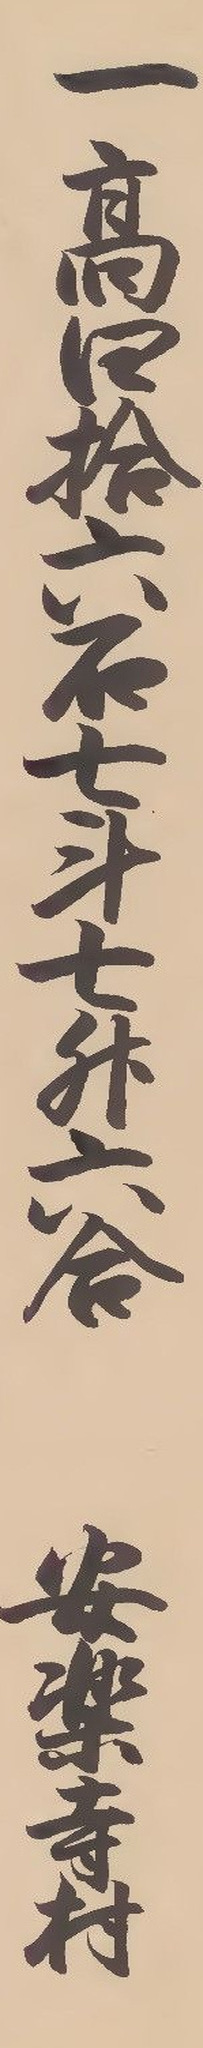一高四拾六石七斗七升六合安楽寺村
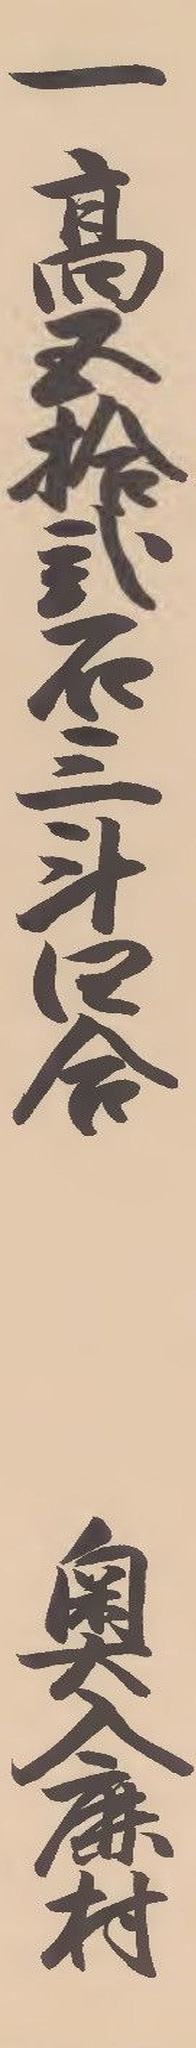一高五拾弐石三斗四合奥入鹿村
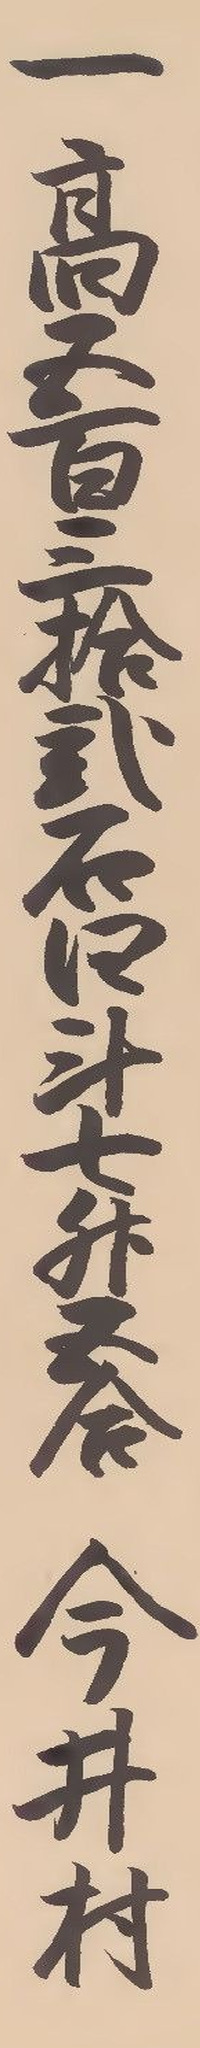一高五百三拾弐石四斗七升五合今井村

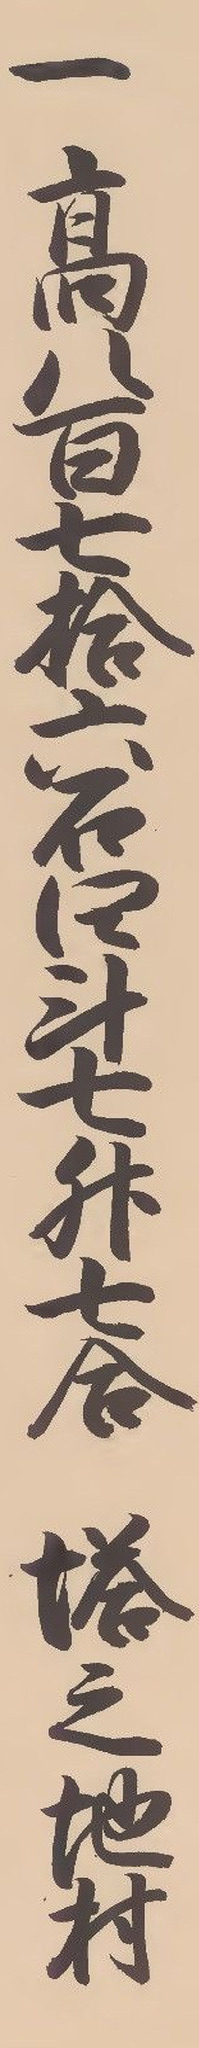一高八百七拾六石四斗七升七合塔之地村
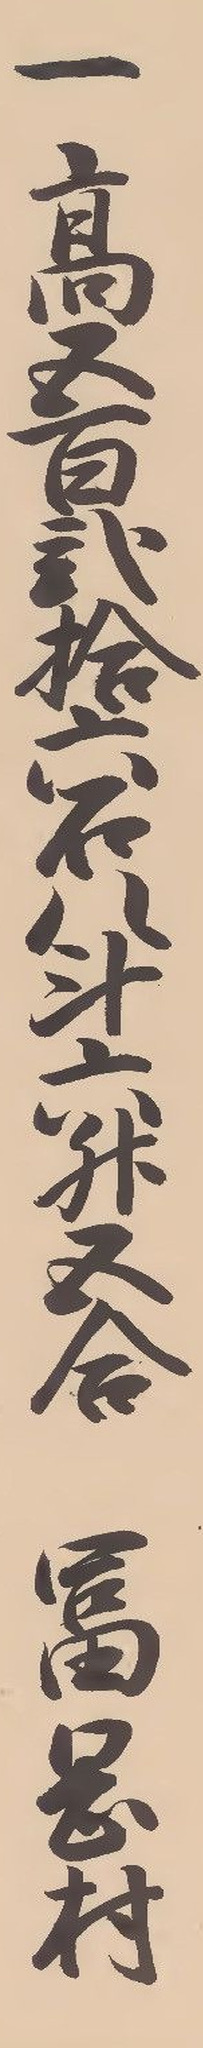一高五百弐拾六石八斗六升五合富岡村
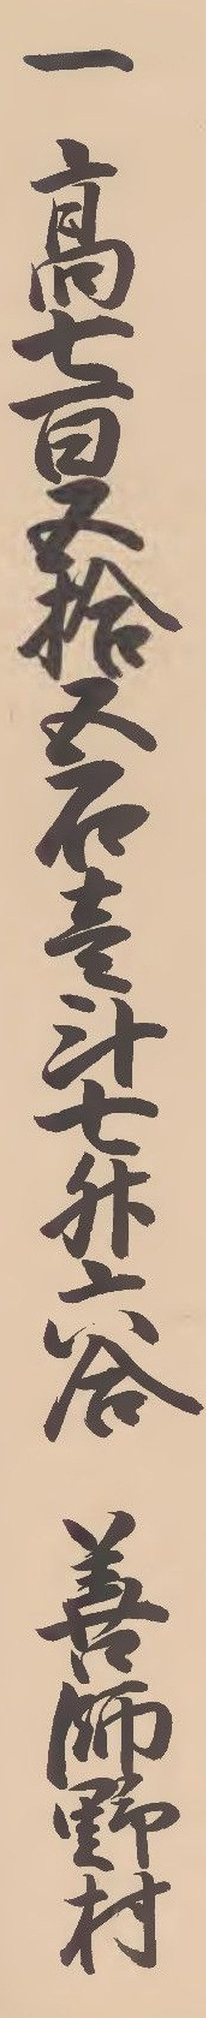一高七百五拾五石壱斗七升六合善師野村
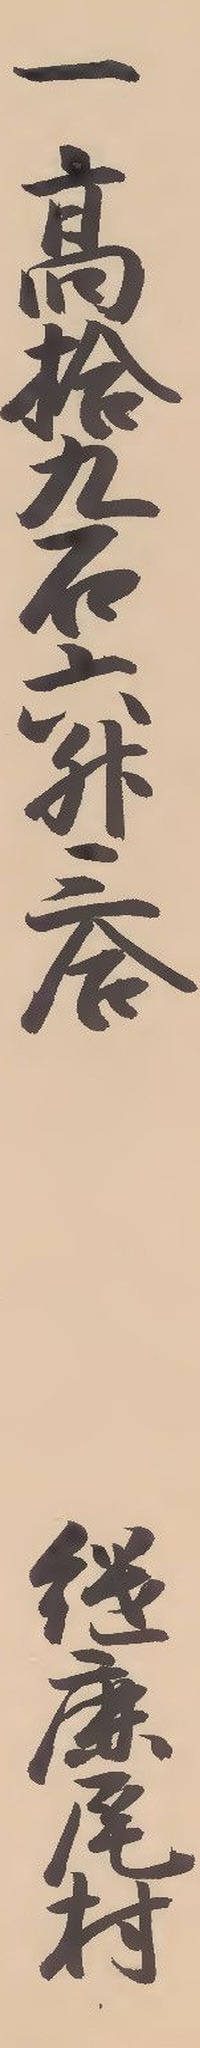一高拾九石六升三合継鹿尾村
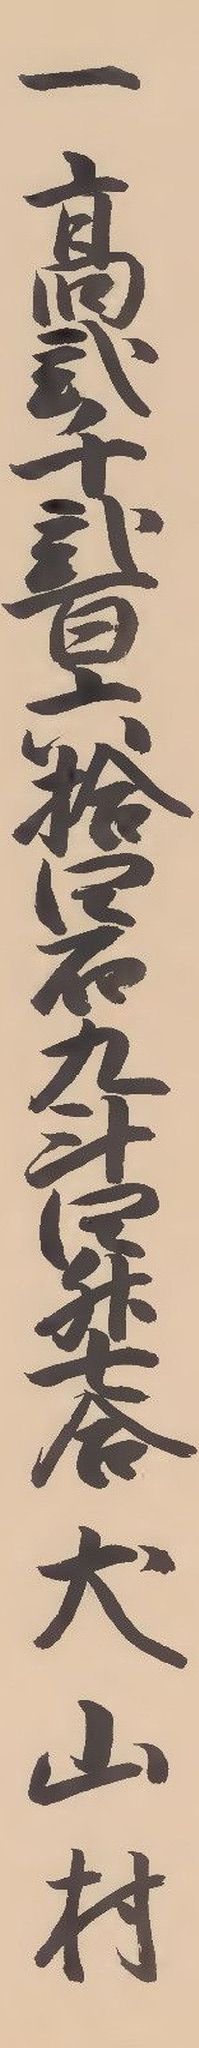一高弐千弐百六拾四石九斗四升七合犬山村
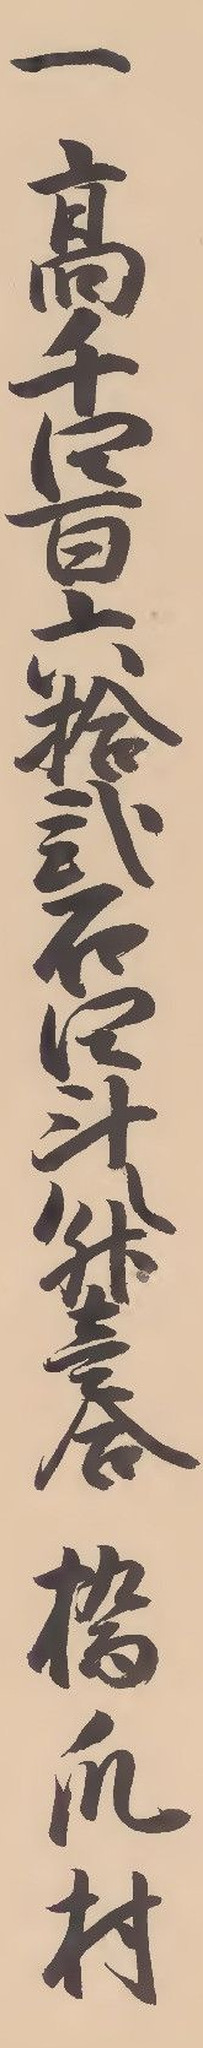一高千四百六拾弐石四斗八升壱合橋爪村

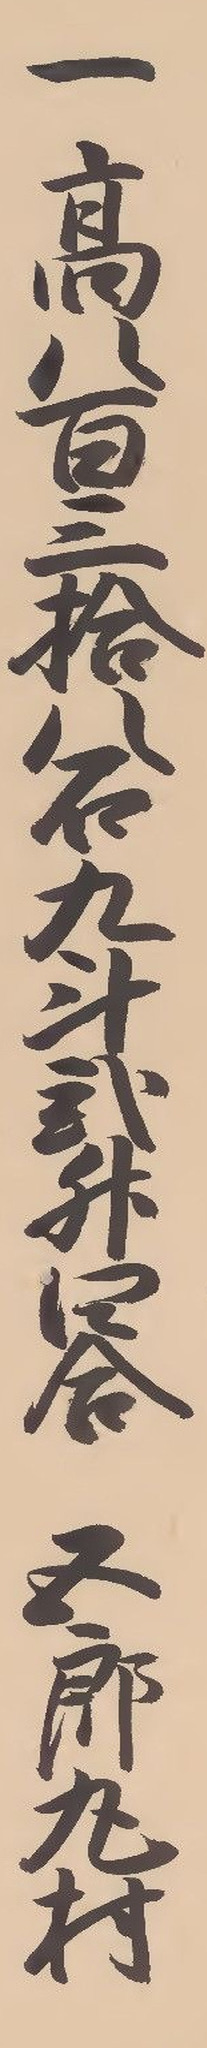一高八百三拾八石九斗弐升四合五郎丸村
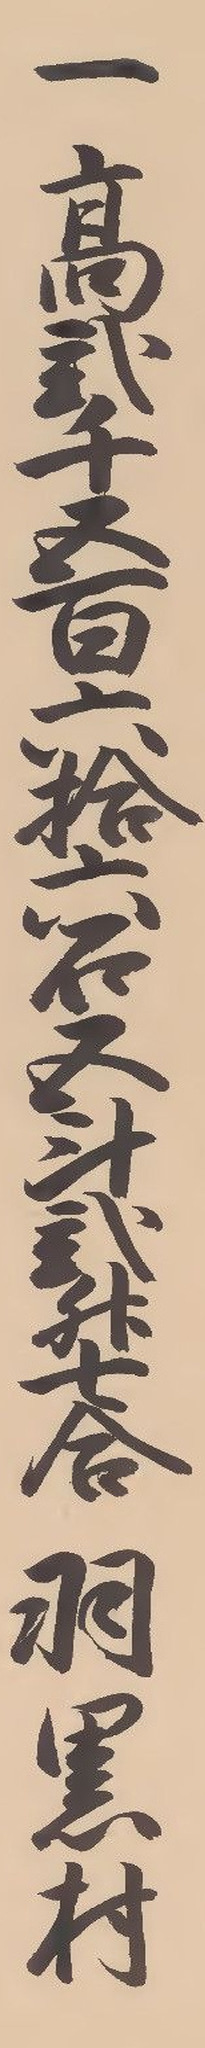一高弐千五百六拾六石五斗弐升七合羽黒村
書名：尾張国郷帳
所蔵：国立公文書館 National Archives of Japan
